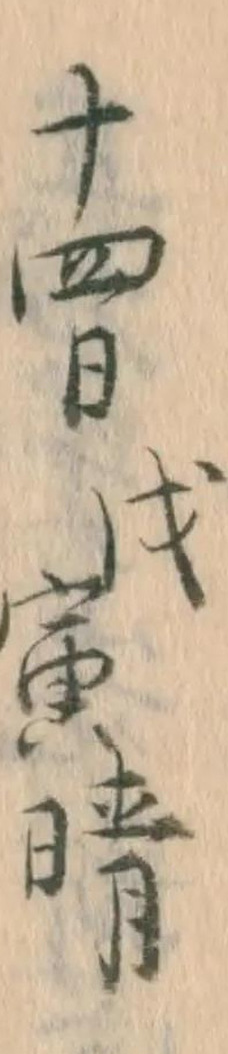十四日戊寅晴
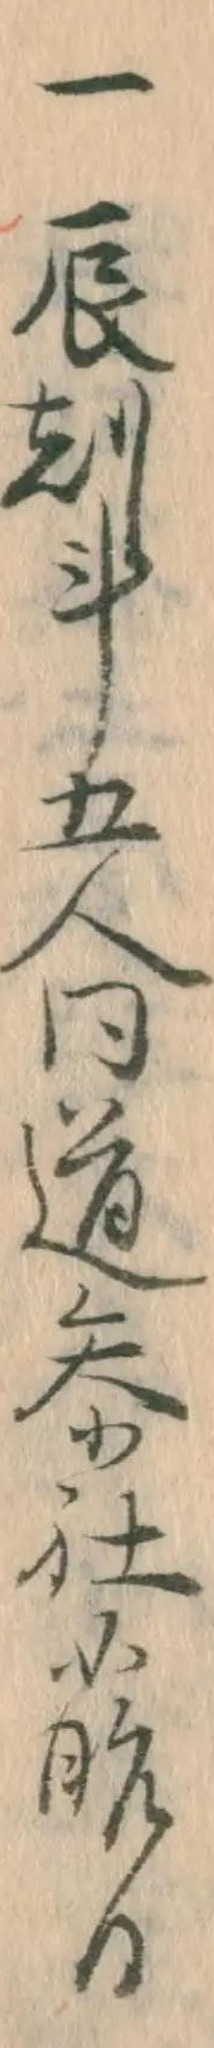一辰刻斗五人同道参社如昨日
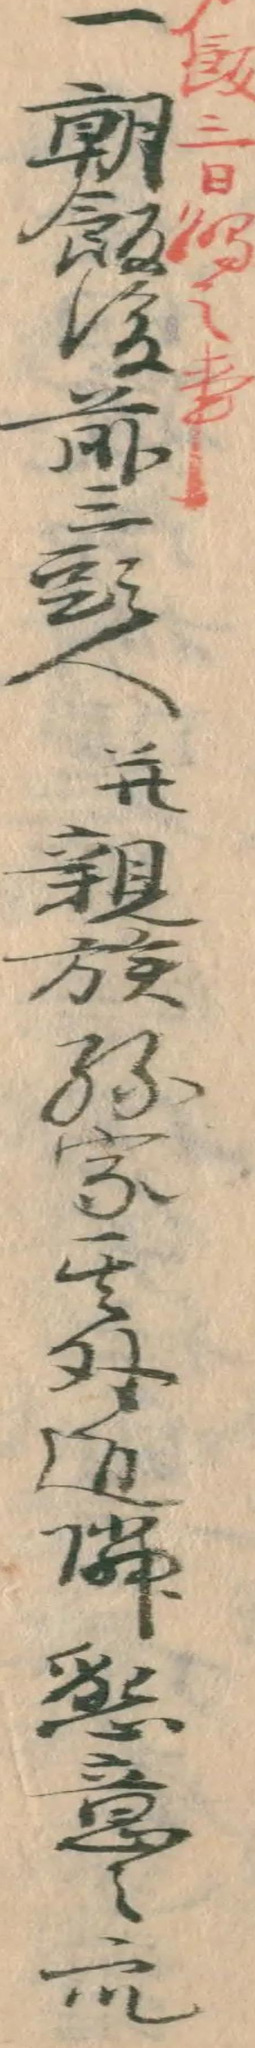一朝飯後前三頭人并親族孫家其外近隣懇意之衆
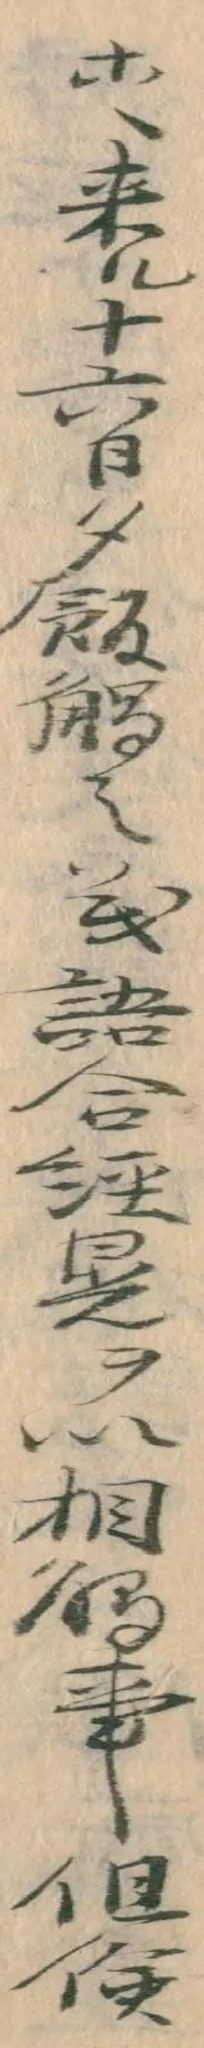等へ来ル十六日夕飯触之義語合経晃ヲ以相触事但倹
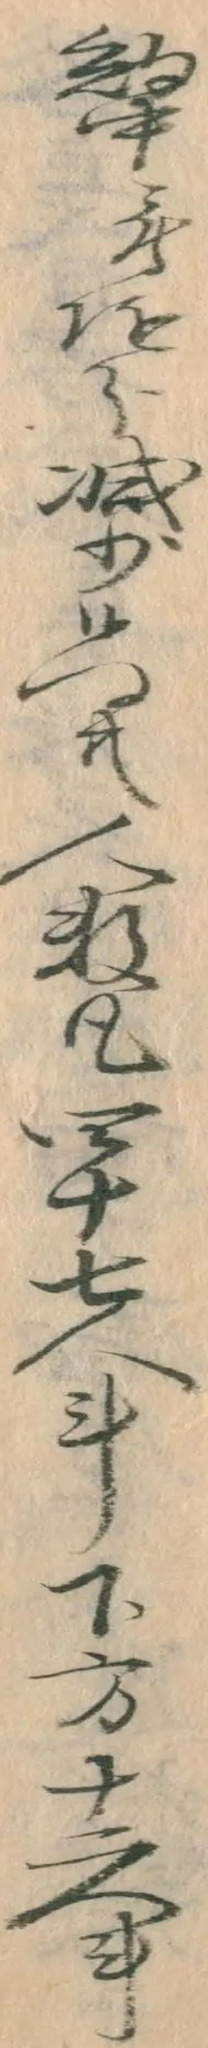約中ニ付随分減少候得共人数凡四十七人斗下方十二人斗
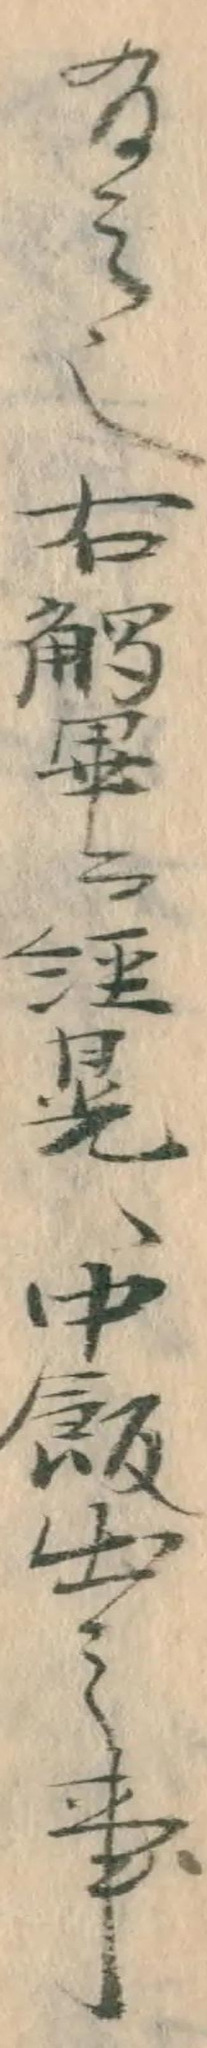有之也右触畢而経晃へ中飯出之事
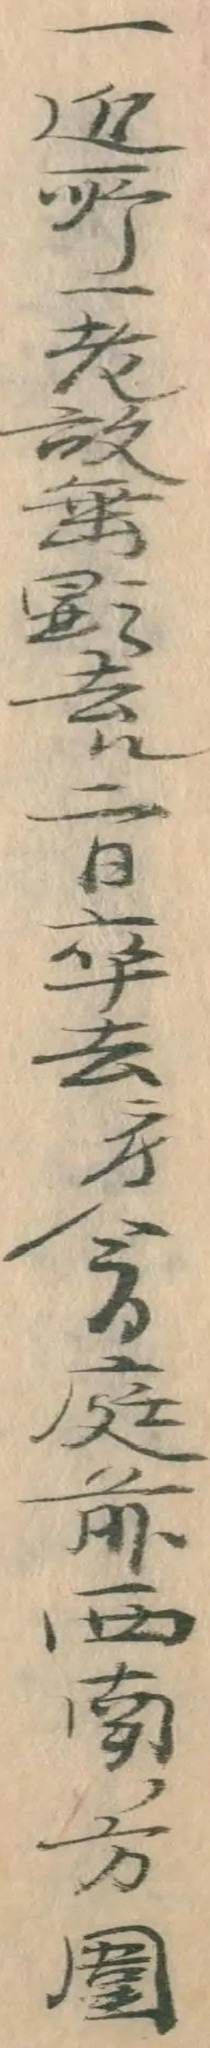一近所一老故垂顕去ル二日卒去ニ付今日庭前西南ノ方圍

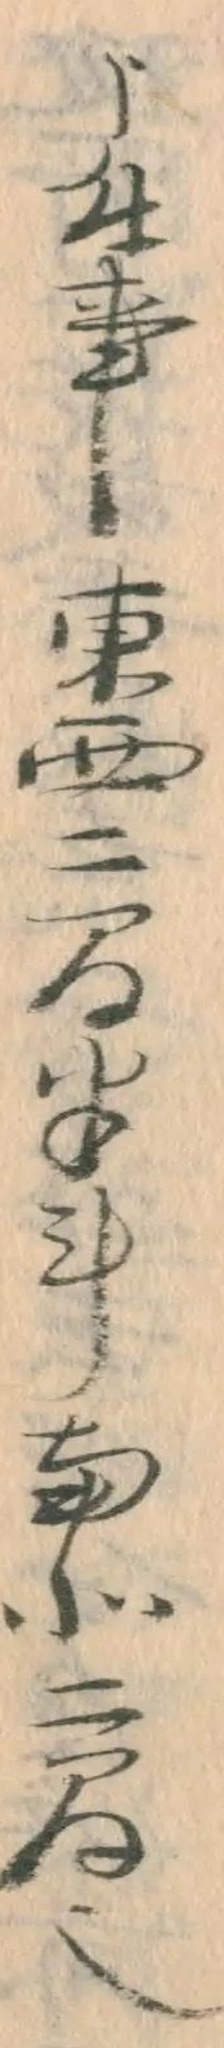申付事東西二間半斗南北二間也
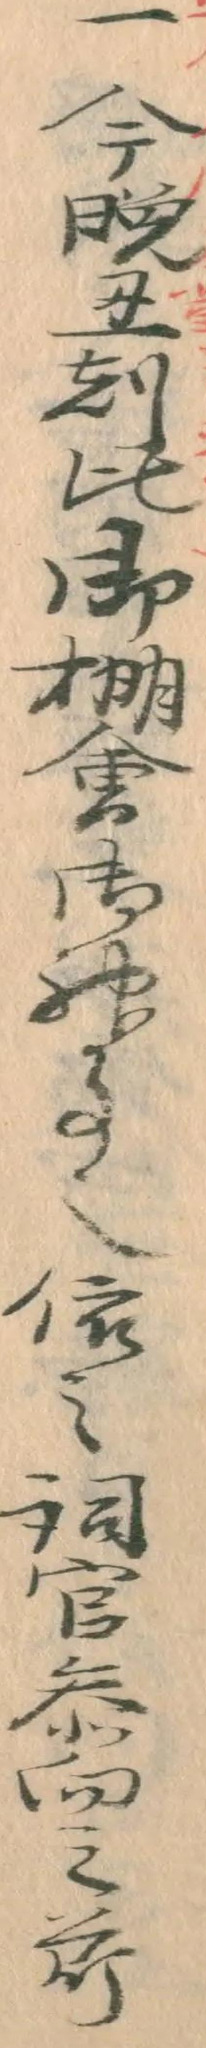一今晩丑刻比御棚會御神事也依之詞官参向之節
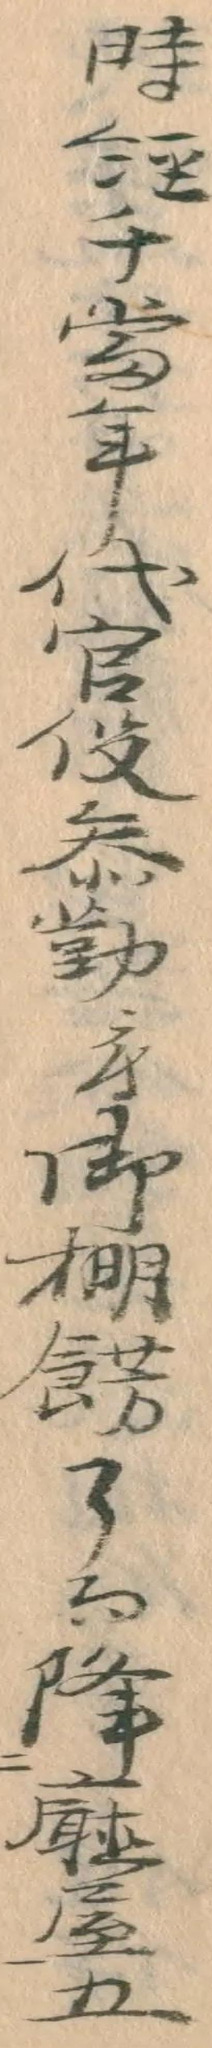時経千當年代官役参勤ニ付御棚餝了而降廰屋五
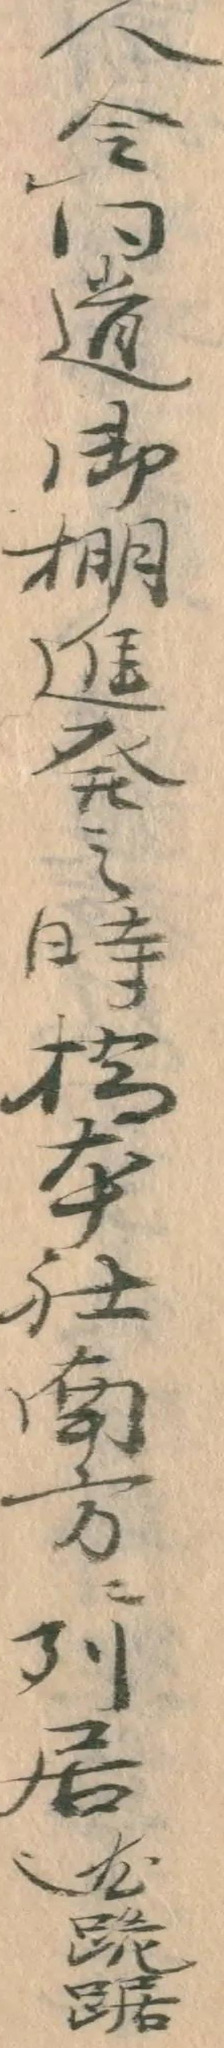人令同道御棚進発之時橋本社南方ニ列居尤蹲踞也
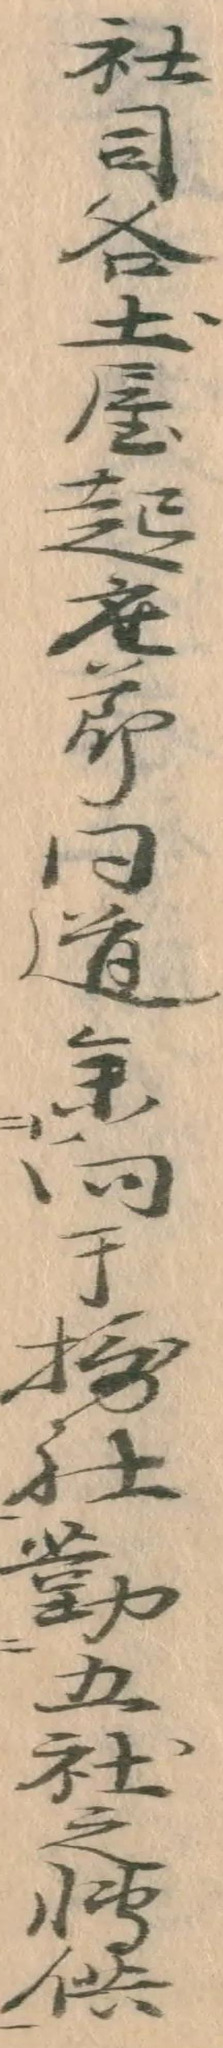社司各土屋起座節同道参向于摂社勤五社之轉供
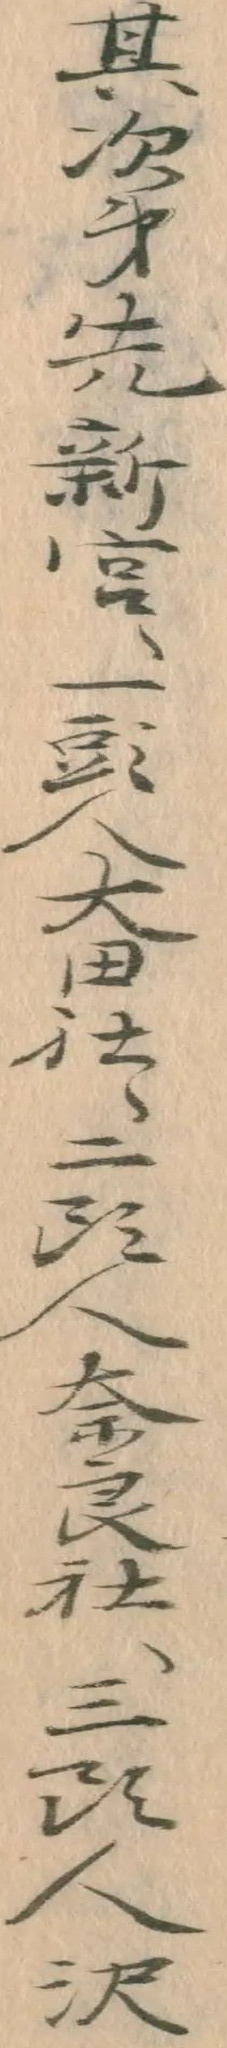其次第先新宮へ一頭人大田社へ二頭人奈良社へ三頭人沢
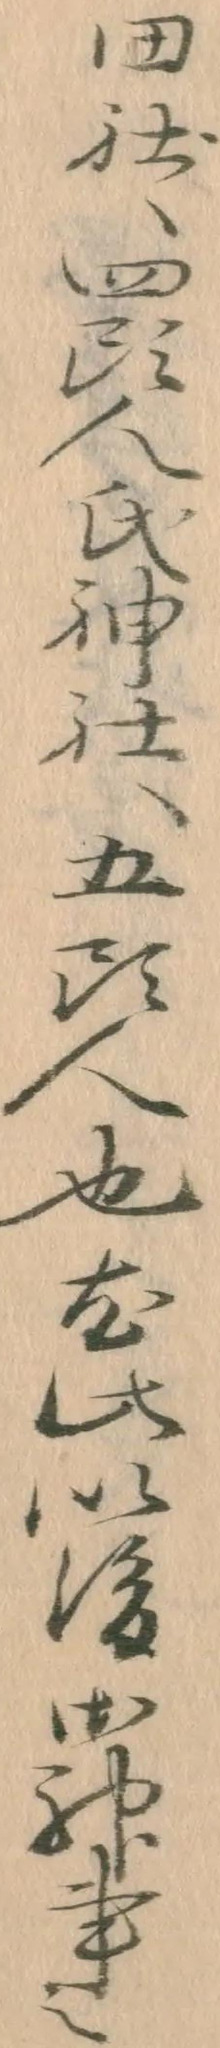田社へ四頭人氏神社へ五頭人也尤此以後御神事之
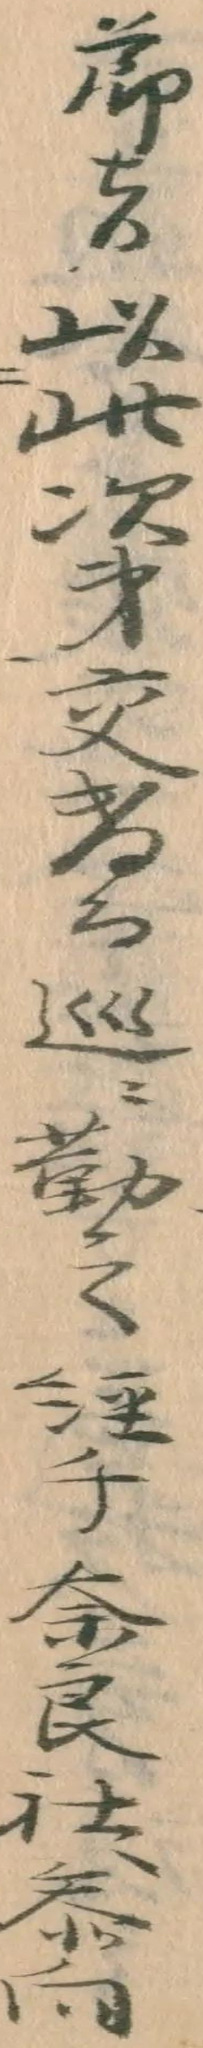節は以此次第交当而巡ニ勤之経千奈良社へ参向
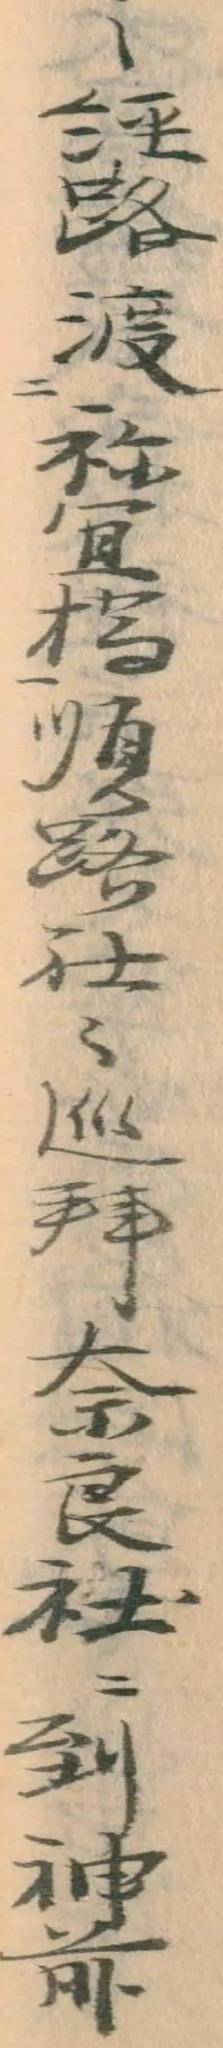也経路渡称宜橋順路社々巡拝奈良社ニ到神前
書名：賀茂社記録. 第72冊
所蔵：国立国会図書館 National Diet Library, JAPAN
